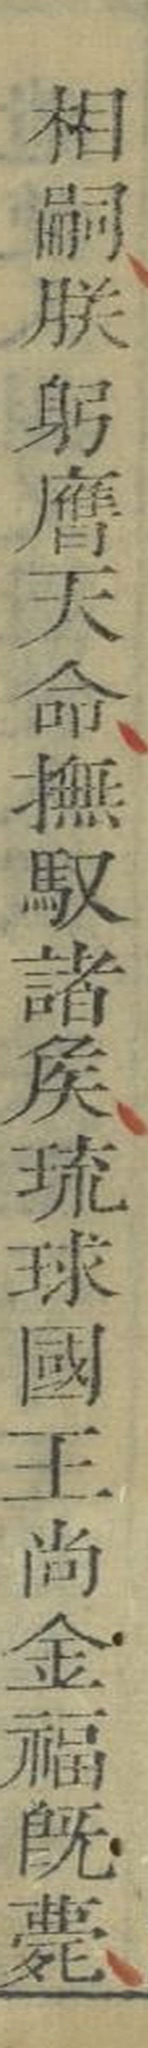相嗣朕躬膺天命撫馭諸侯琉球国王尚金福既薨
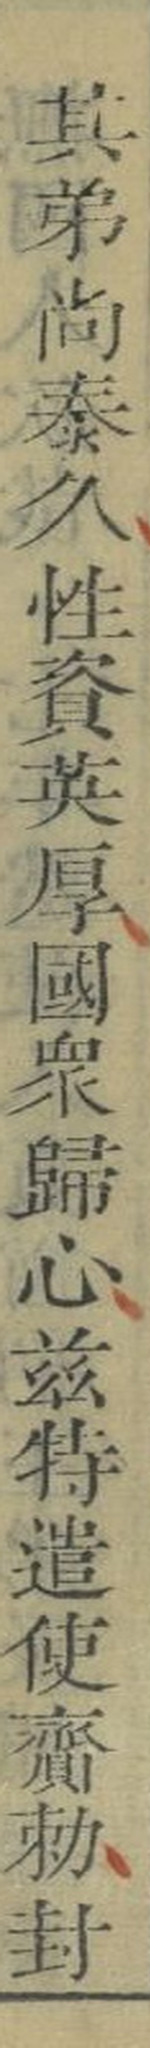其弟尚泰久性資英厚国衆帰心茲特遣使齎勅封
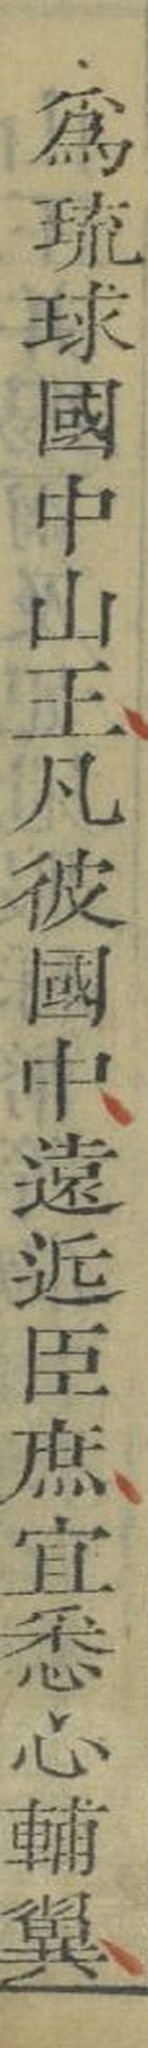為琉球国中山王凡彼国中遠近臣庶宜悉心輔翼
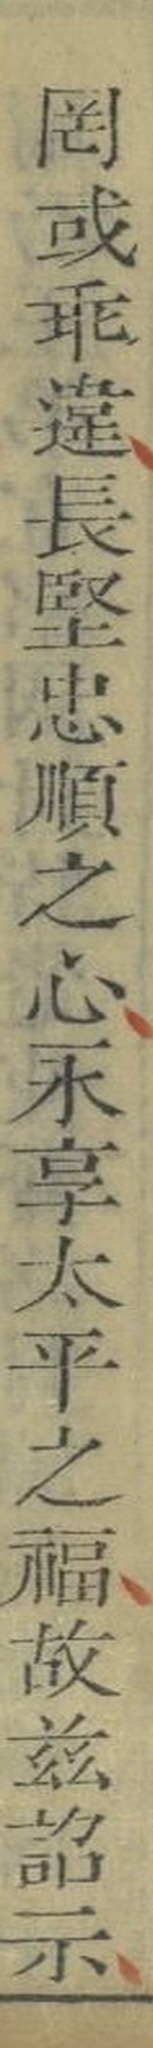罔或乖違長堅忠順之心永享太平之福故茲詔示
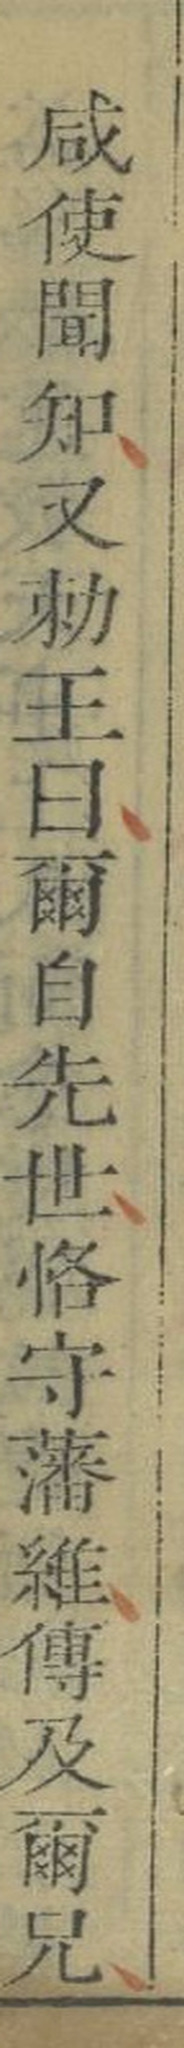咸使聞知又勅王曰爾自先世恪守藩維伝及爾兄

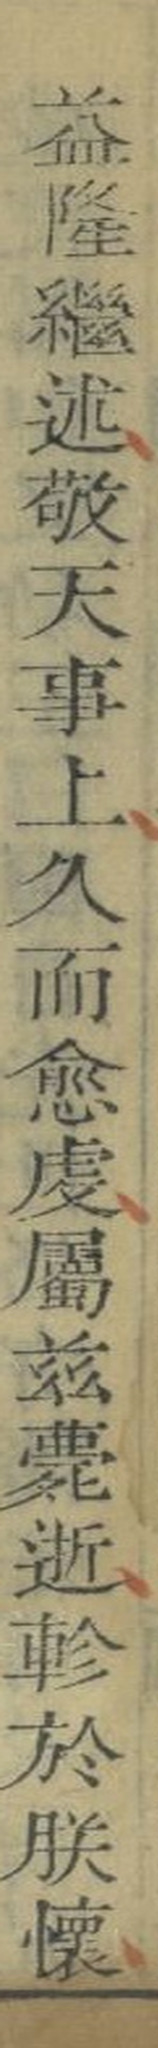益隆継述敬天事上久而愈虔属茲薨逝軫於朕懐
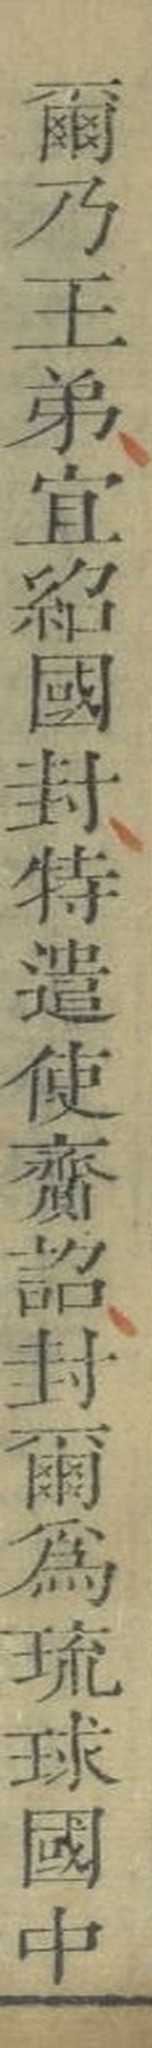爾乃王弟宜紹国封特遣使齎詔封爾為琉球国中
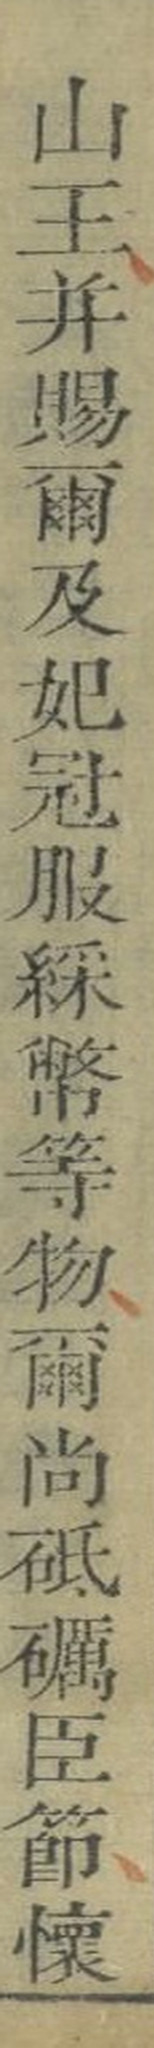山王并賜爾及妃冠服綵幣等物爾尚砥礪臣節懐
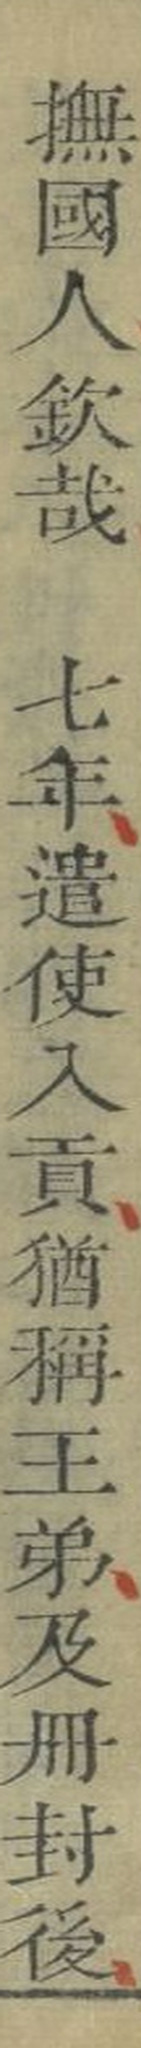撫国人欽哉七年遣使入貢猶称王弟及冊封後
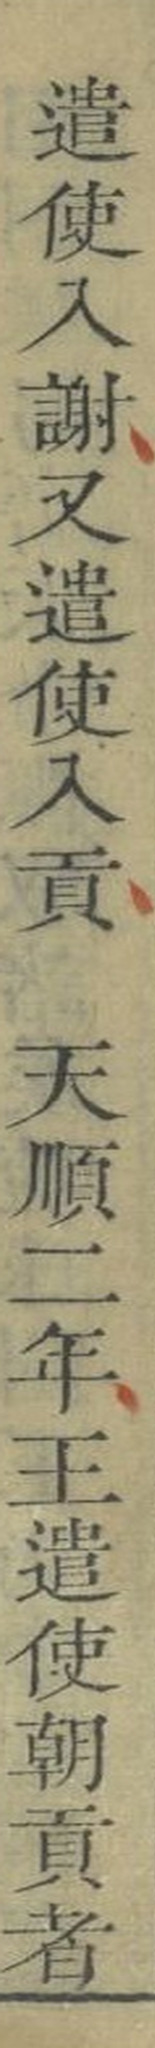遣使入謝又遣使入貢天順二年王遣使朝貢者
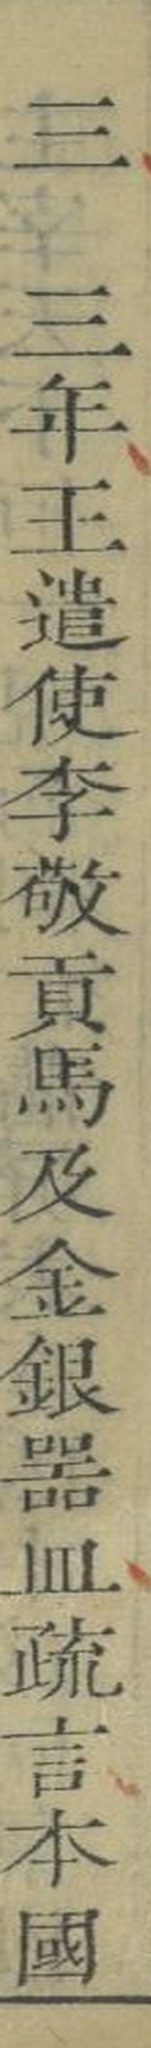三三年王遣使李敬貢馬及金銀器皿疏言本国
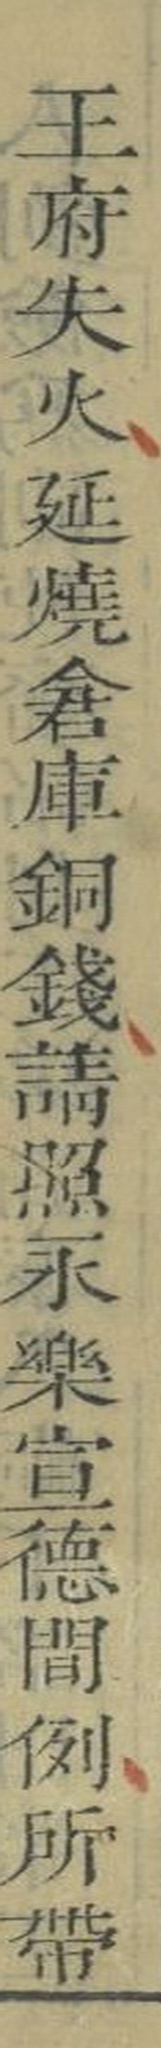王府失火延焼倉庫銅銭請照永楽宣徳間例所帯
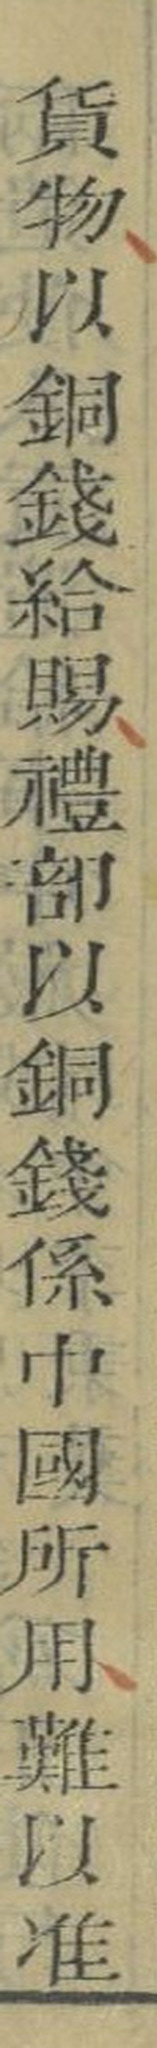貨物以銅銭給賜礼部以銅銭係中国所用難以准
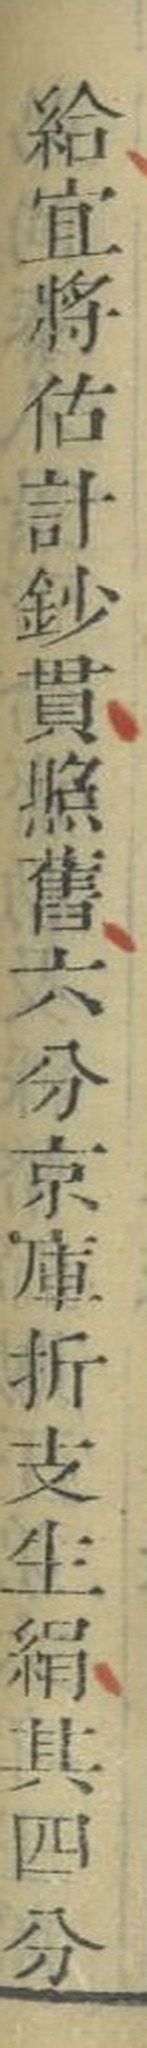給宜将估計鈔貫照旧六分京庫折支生絹其四分
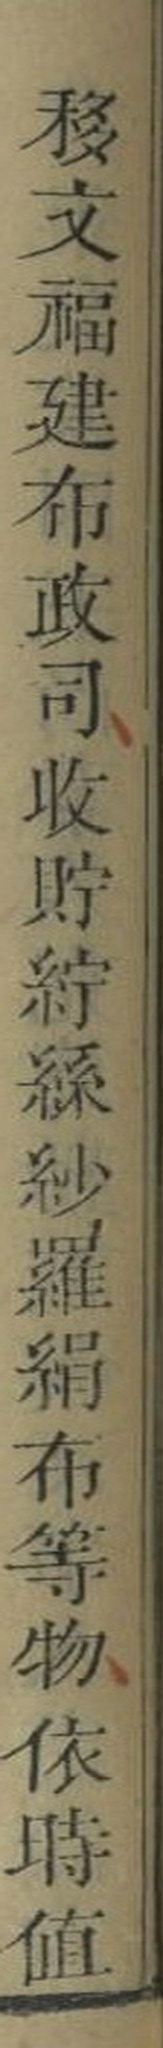移文福建布政司収貯紵糸紗羅絹布等物依時値
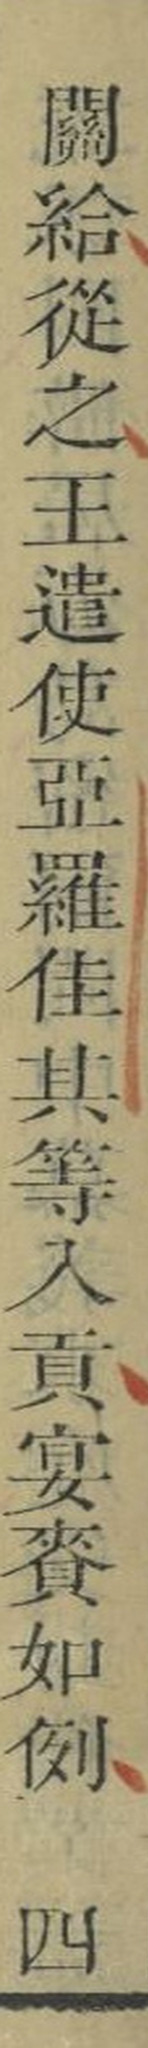関給従之王遣使亜羅佳其等入貢宴賚如例四
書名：中山伝信録 巻三
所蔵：University of the Ryukyus Library
